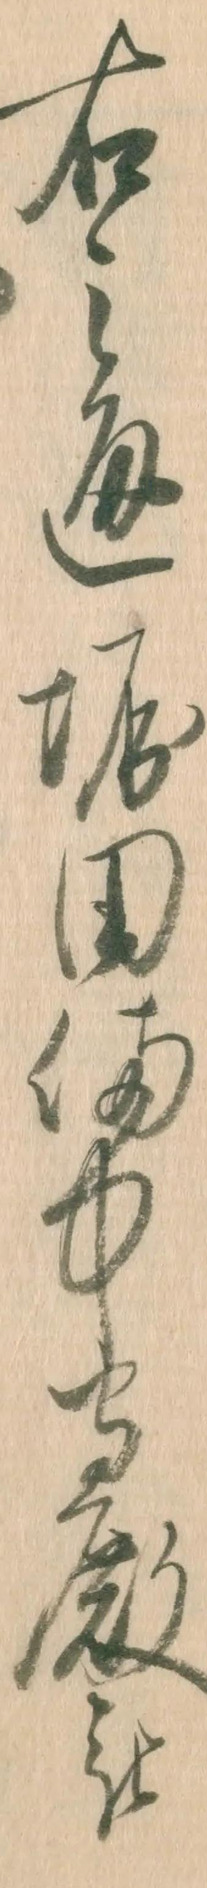右之通堀田備中守殿被
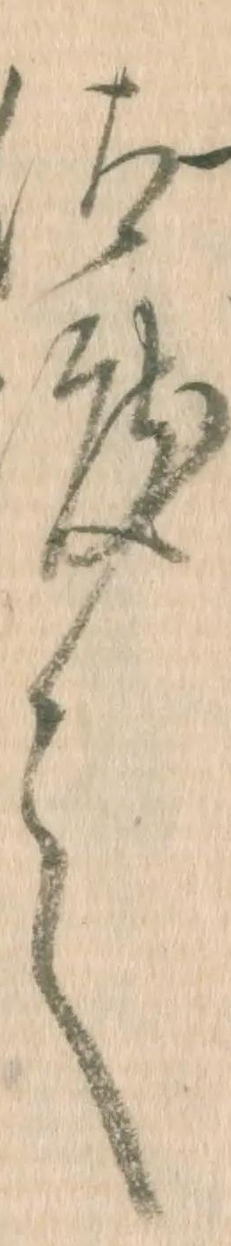仰渡之

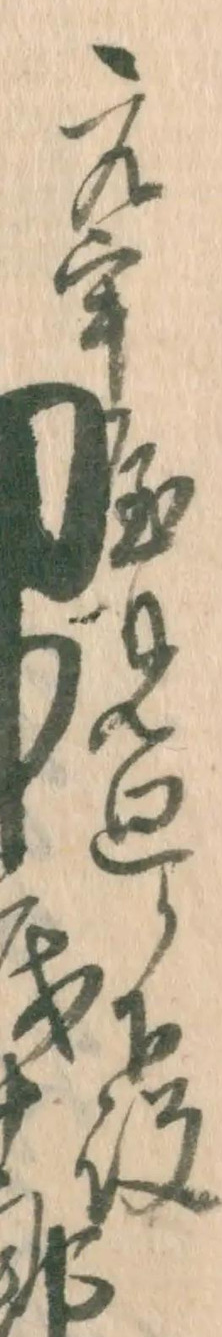元牢屋敷見廻り下役
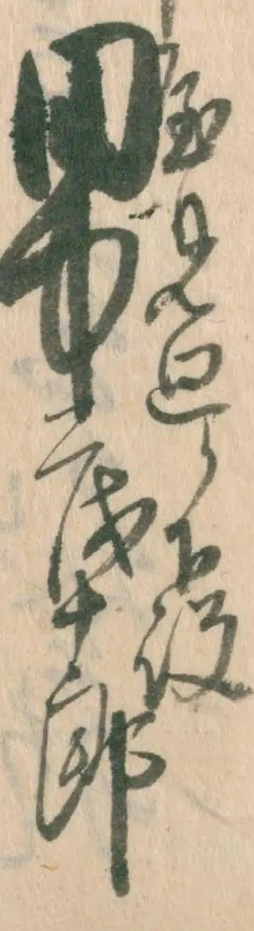田中茂十郎
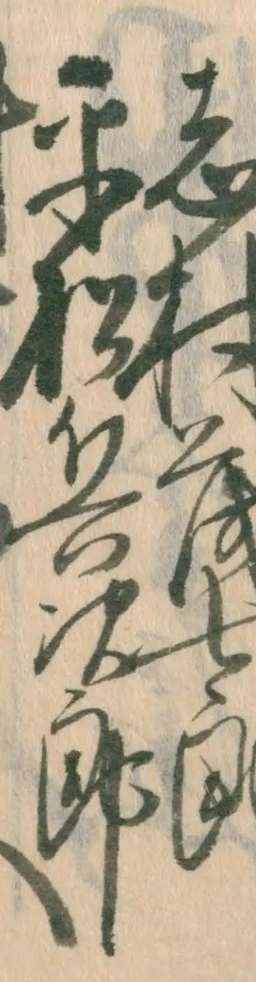平松兵次郎
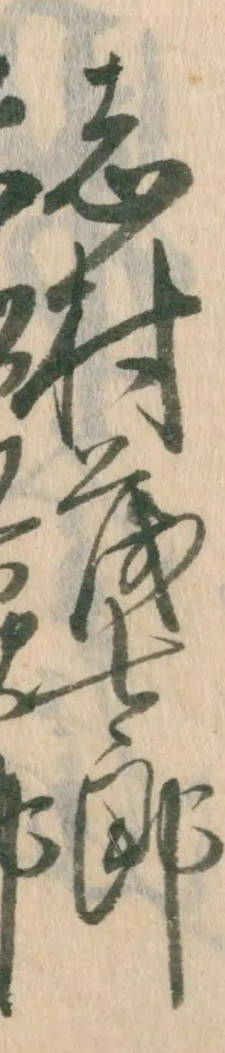志村茂七郎
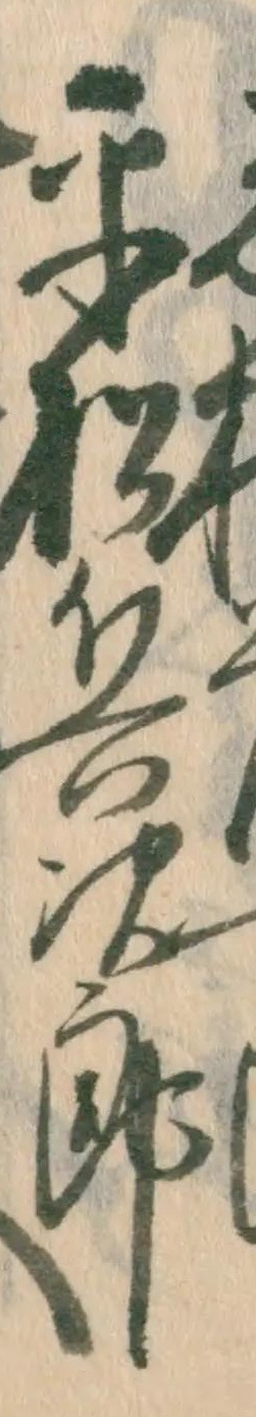平松兵次郎
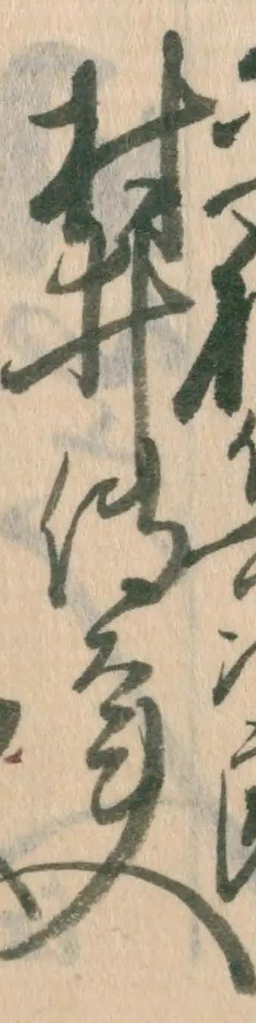村井伝太夫
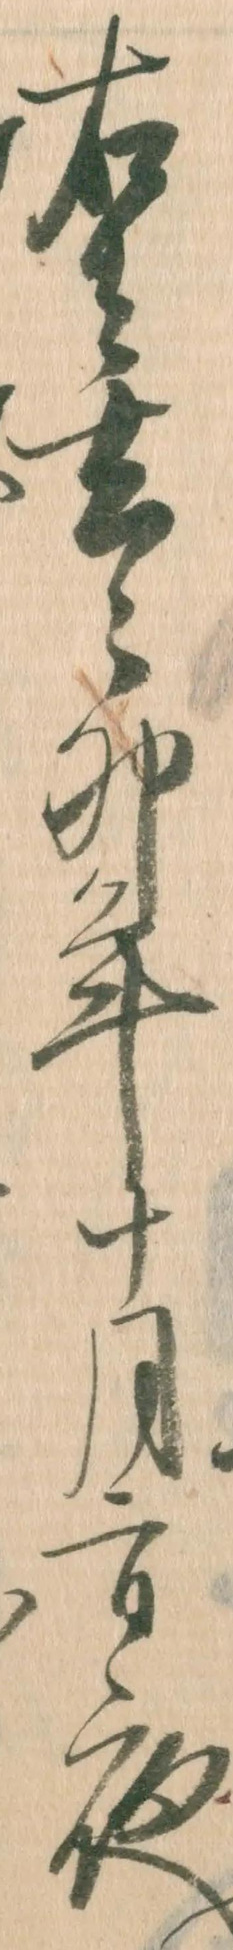右は去〻卯年十月二日夜
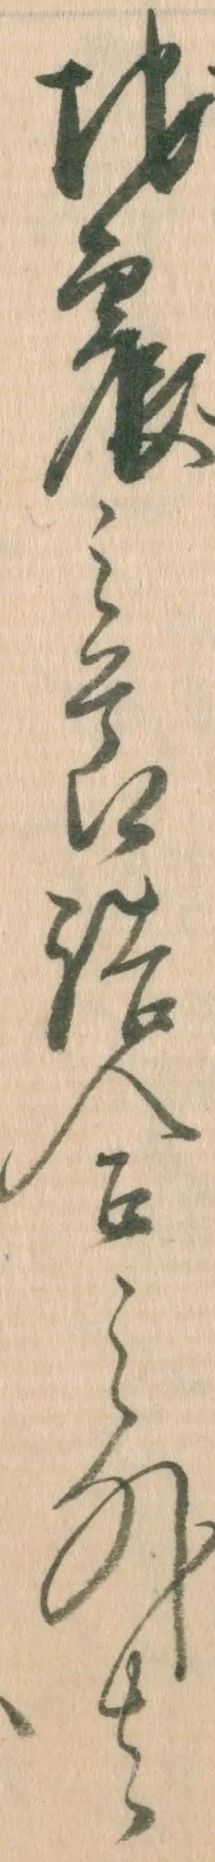地震之節詰合之外は
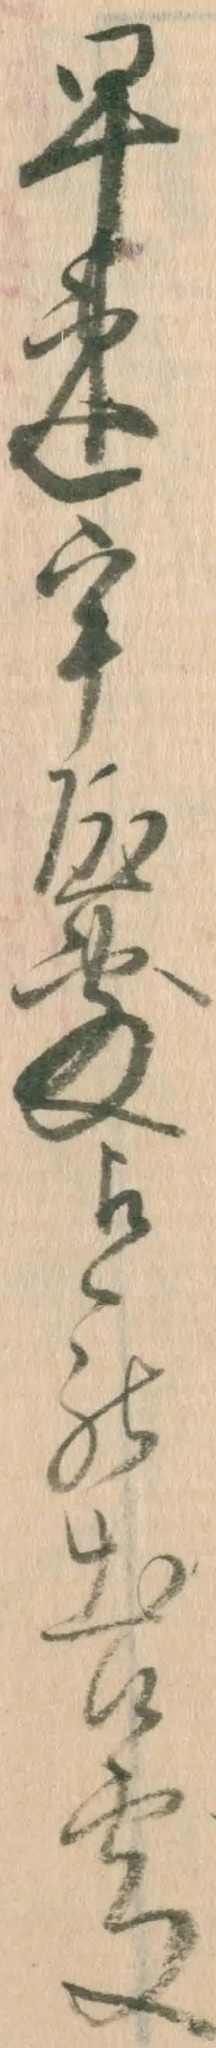早速牢屋敷え罷出候処
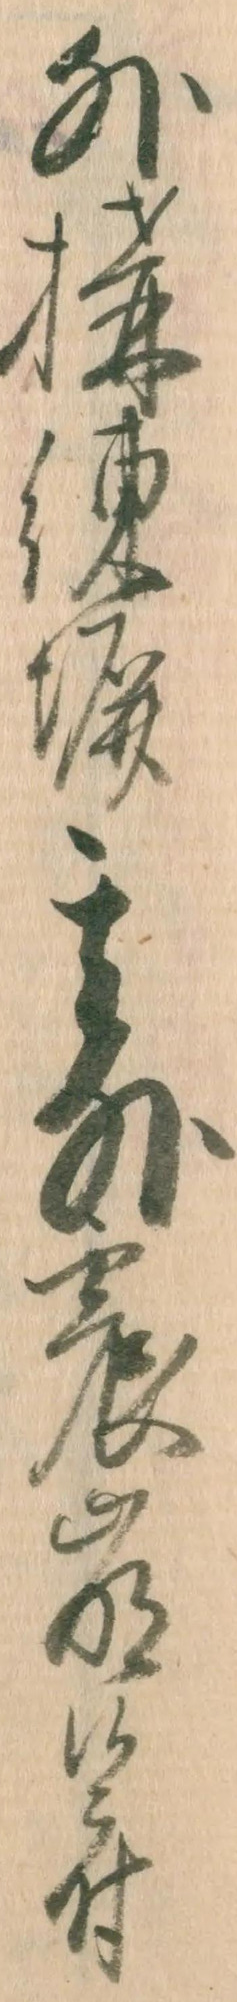外構煉塀其外震崩候ニ付
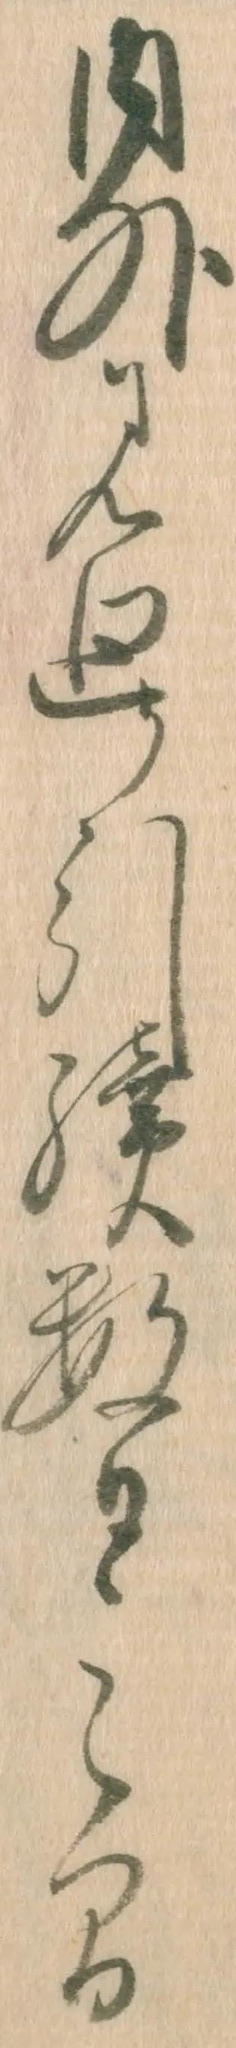内外見廻り引続数日之間
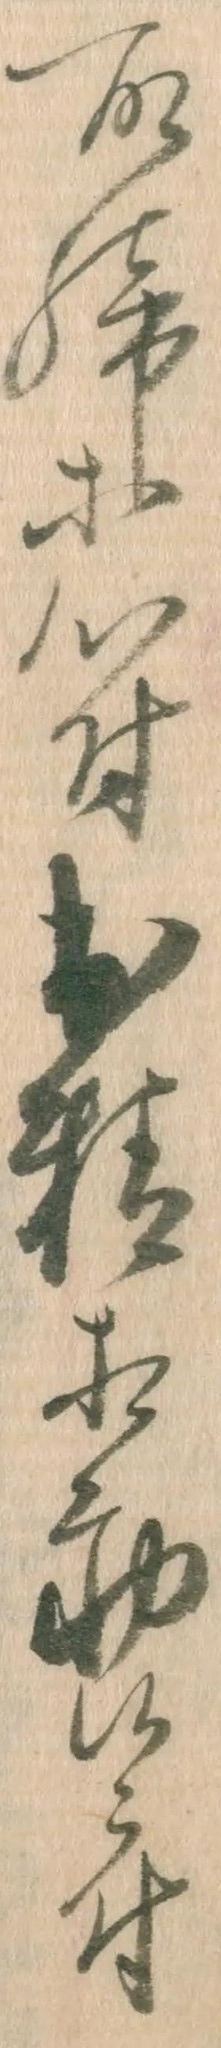取締等心付出精相勤候ニ付
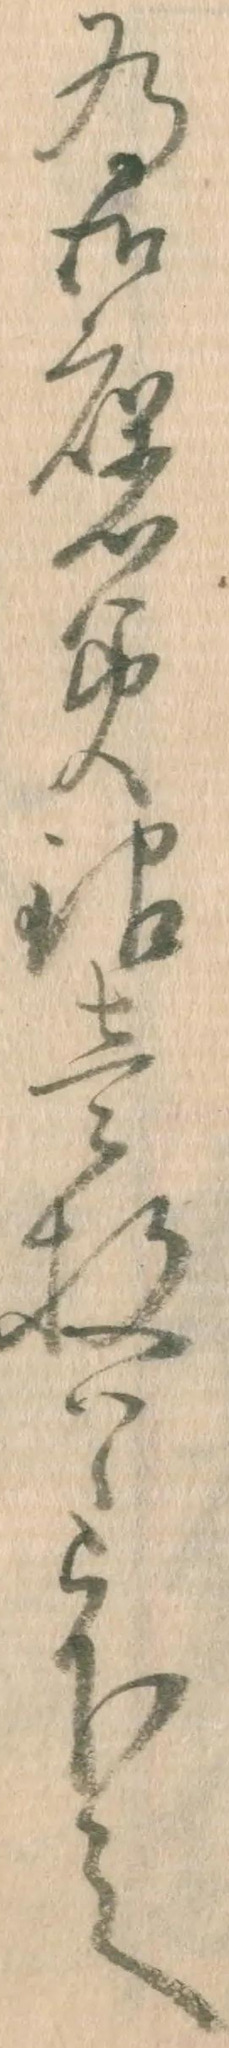為御褒美銀壱枚ツヽ被下之
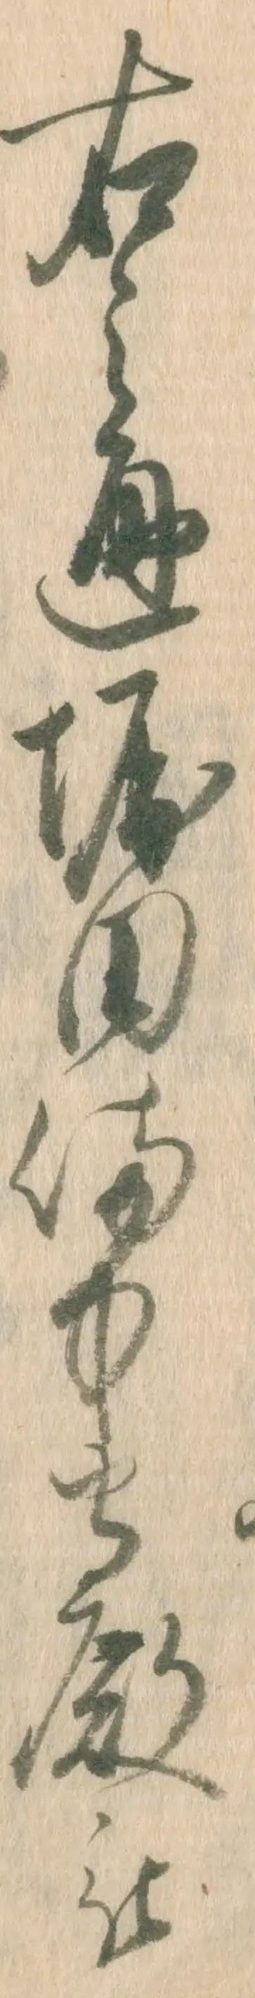右之通堀田備中守殿被
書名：七十冊物類集 71巻. [44] 四十三 牢屋敷御普請御修覆地震ニ付骨折候牢屋掛御褒美之部
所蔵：国立国会図書館 National Diet Library, JAPAN
